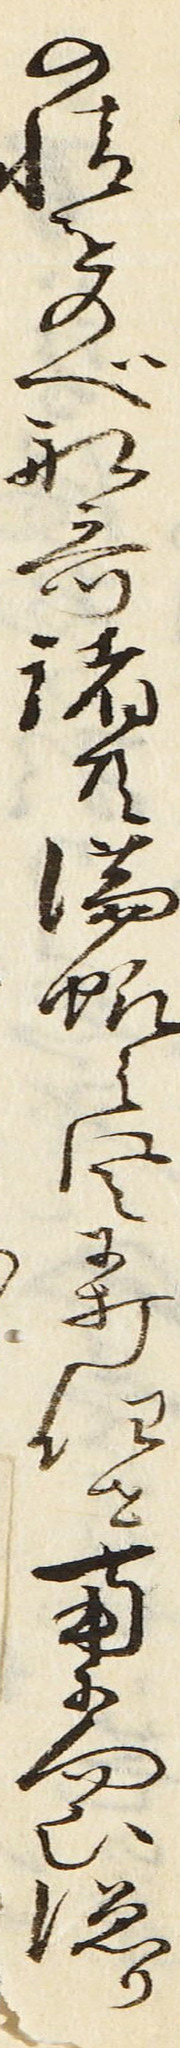の情をのべ船寄諸共満帆之風に打任せ南に向ひ漁り
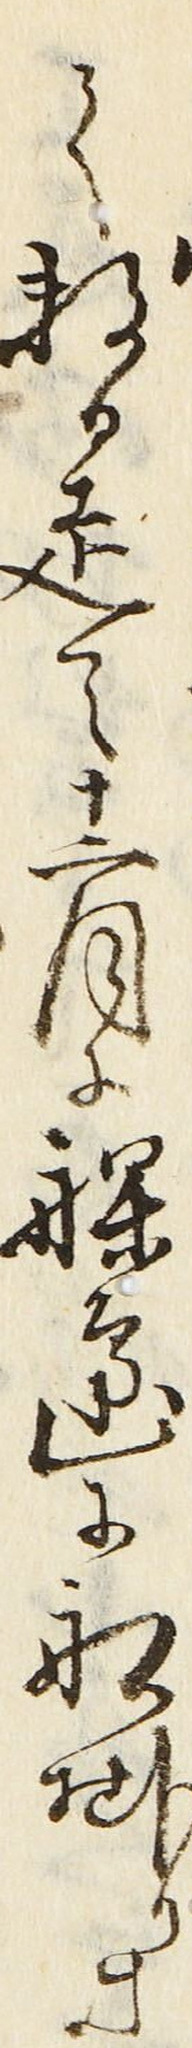て数日走て十二月に裸島に船掛りす
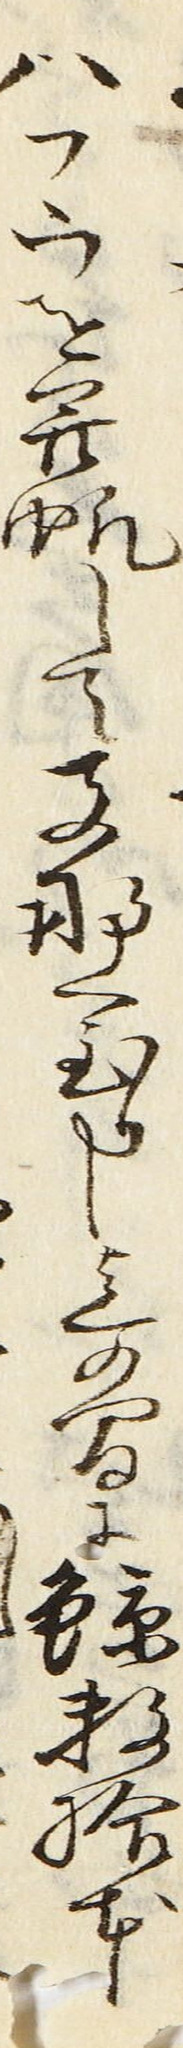ハフウを開帆して支那へ至りし迄の間に鯨数拾本
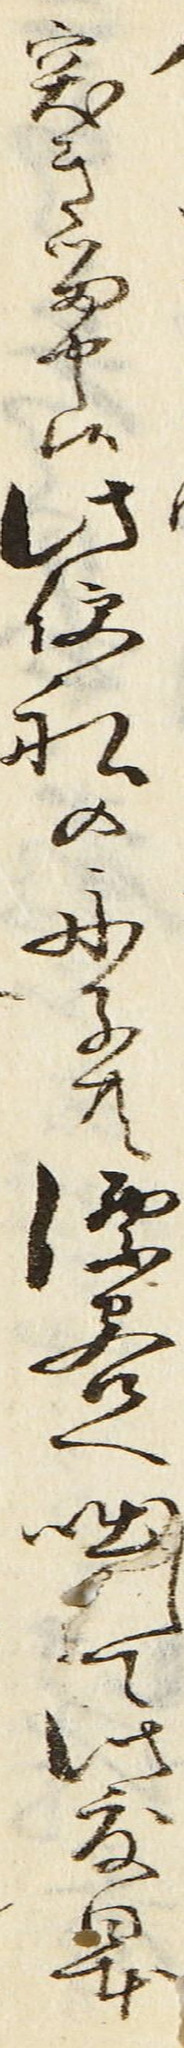突き留中候此便船の舟子共漂客へ咄して此度日本
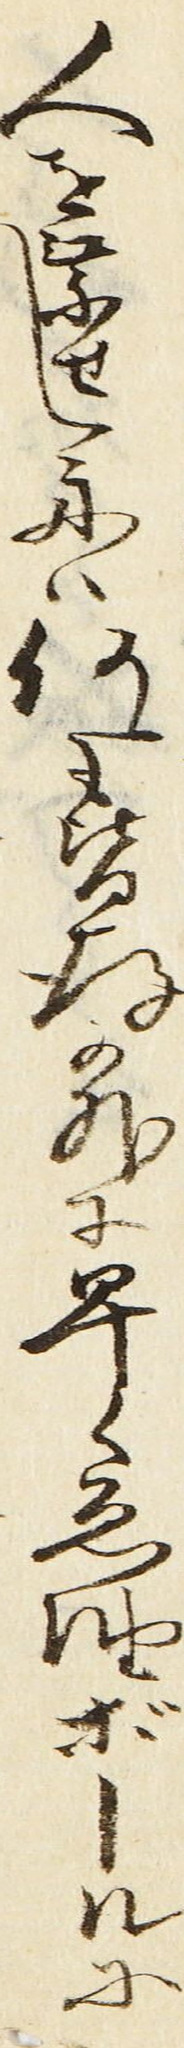人を乗せし舟ハ何も皆存の外に早く魚油ボールに
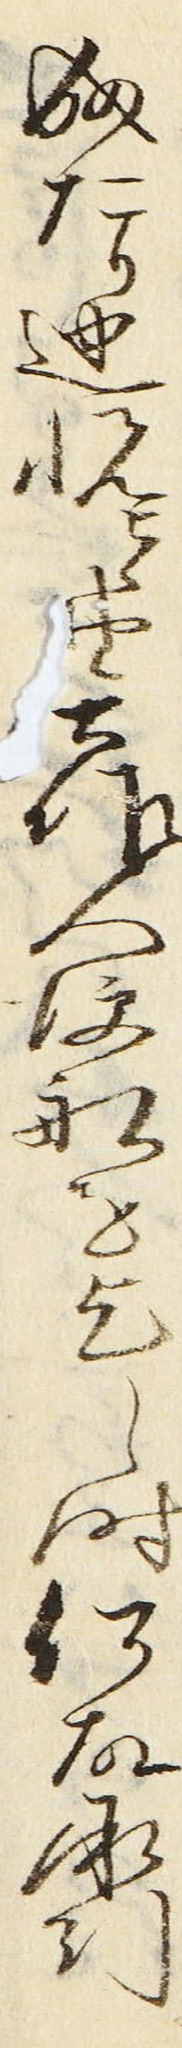成たり迚悦ヒ候由土佐人便船を乞し時何故承引

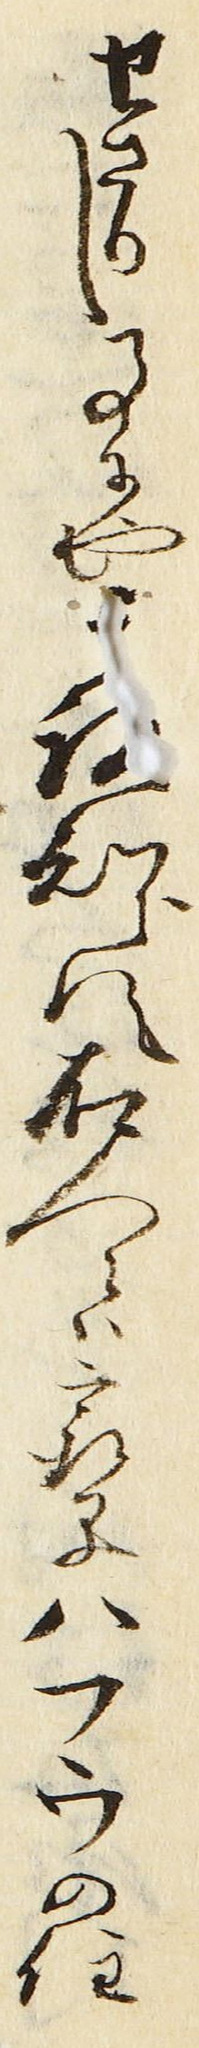せさりし事にや其訳知らす右人々ハ最早ハフウの住
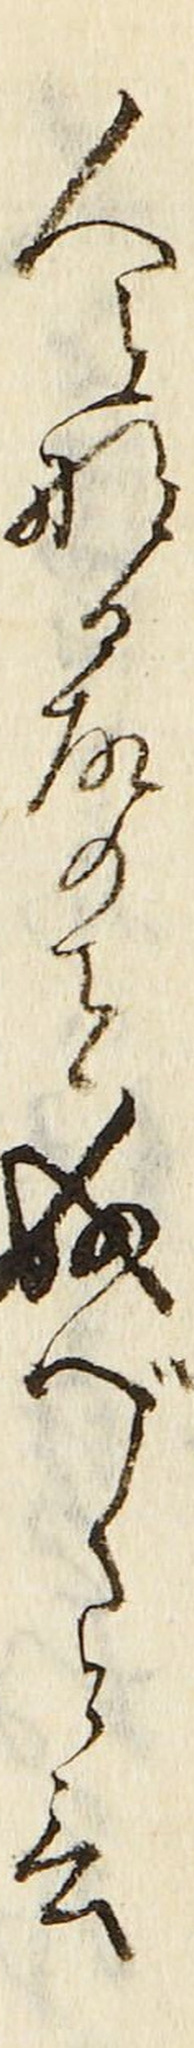人となる故のこと成べしと言
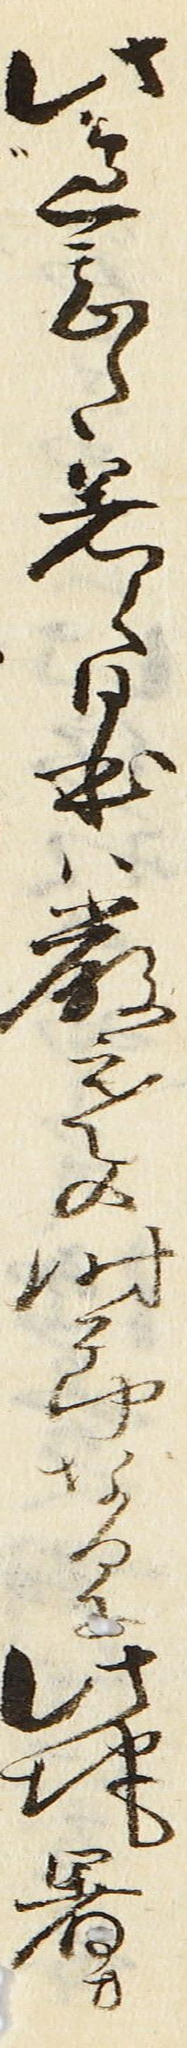此島甚た暑く日本ハ厳寒の時節なるを此地暑サ
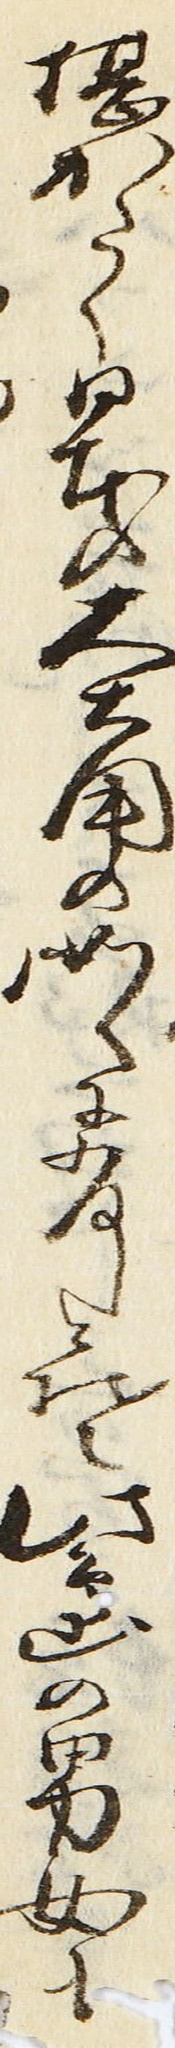堪がたく日本の大土用の如くに有しとそ此島の男女も
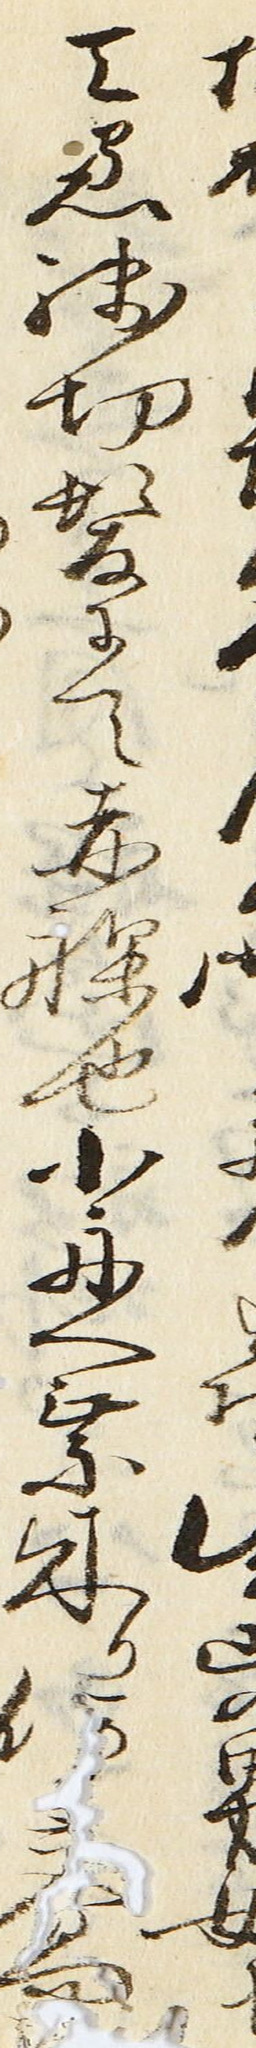天窓残切髪にて赤裸也小舟へ乗来り何向
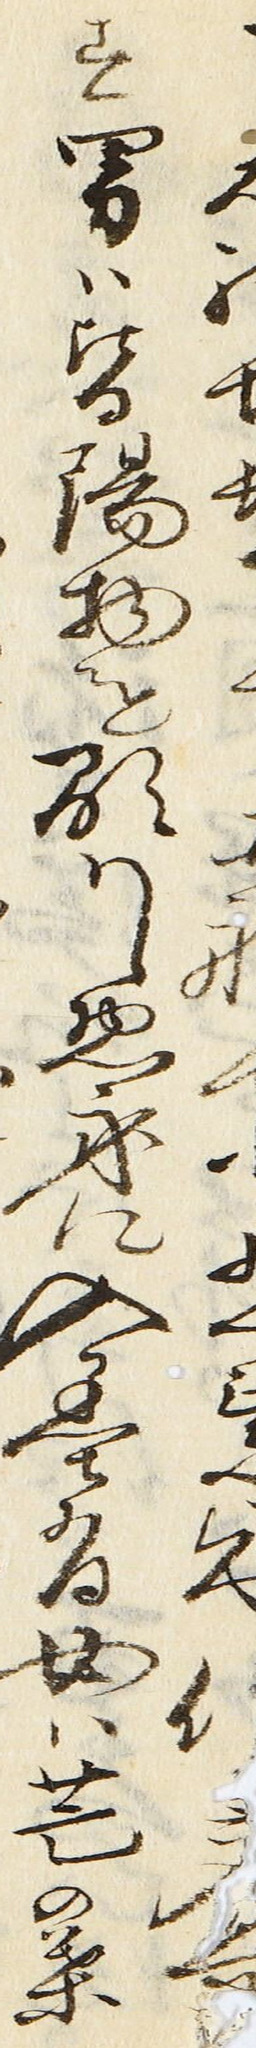壱男ハ皆陽物を顕ハし惣身に入墨有女ハ芒の葉
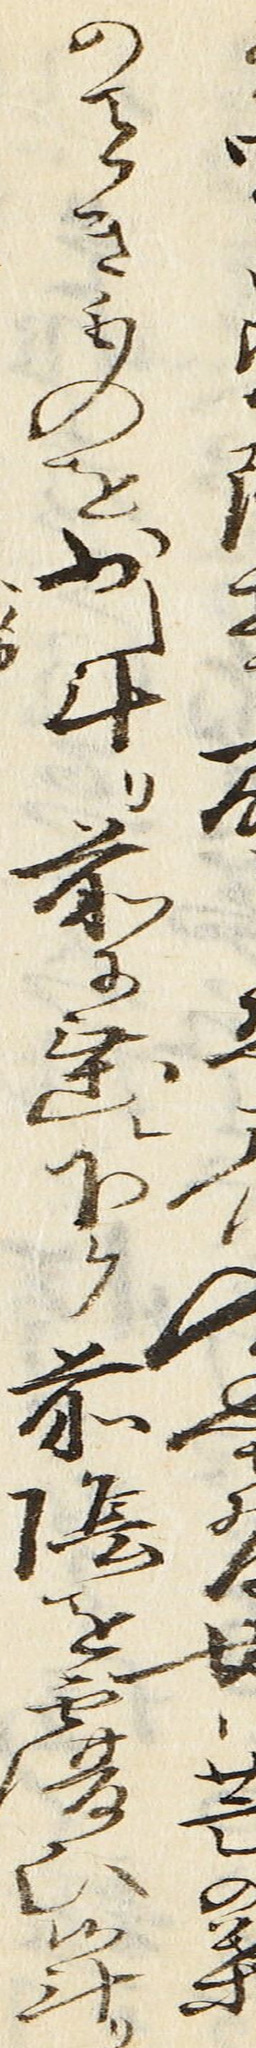のこときものを少し計り前に垂レ下ケ前陰を覆ひ候計り
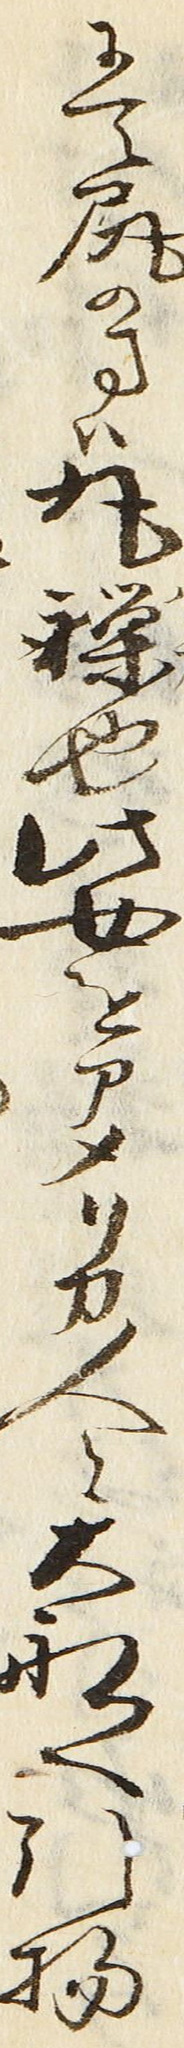にて尻の方ハ丸裸也此女をアメリカ人と大船へ引揚
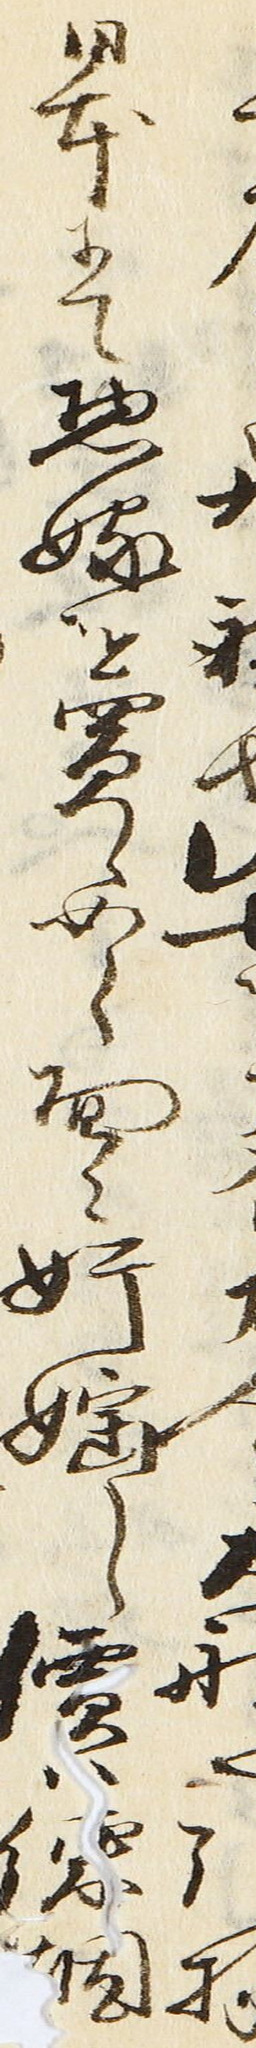日本まて惣嫁を買か如く面々奸媱し価ハ烟
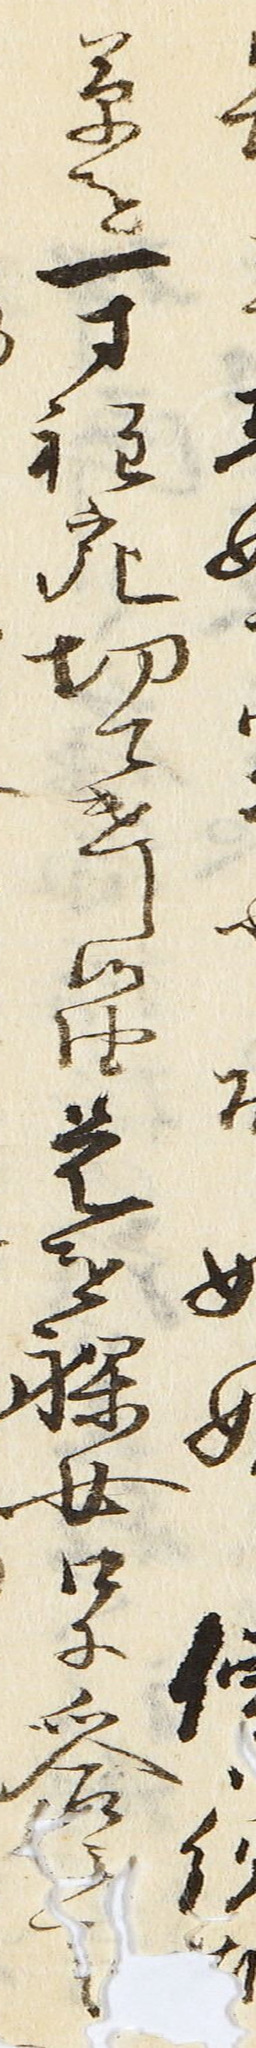草を一寸程宛切て遣し候由是を裸女口に含ミて
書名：亜墨利加漂流記聞
